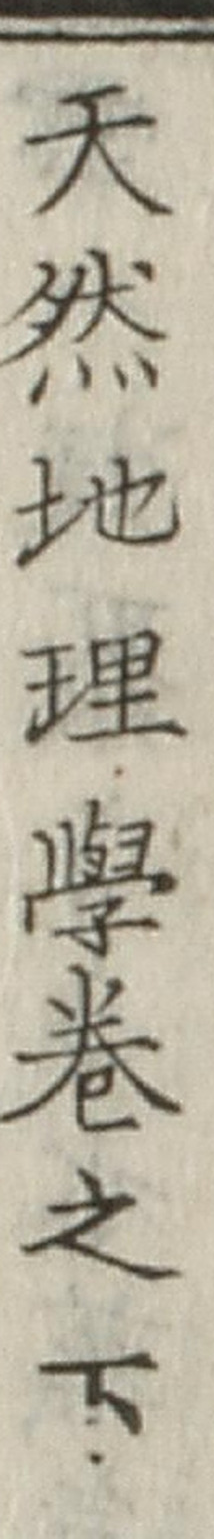天然地理学巻之下
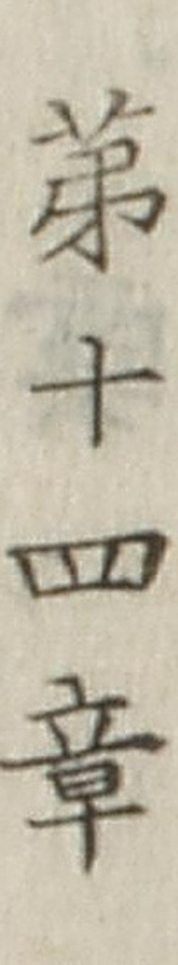第十四章
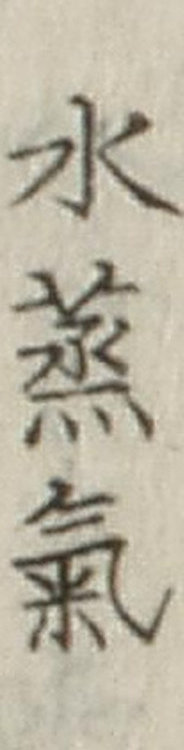水蒸気
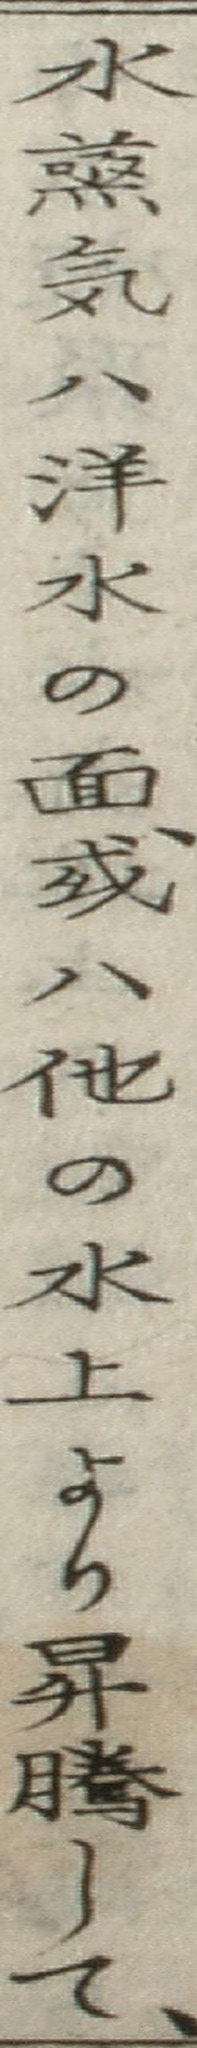水蒸気は洋水の面、或は他の水上より昇騰して、
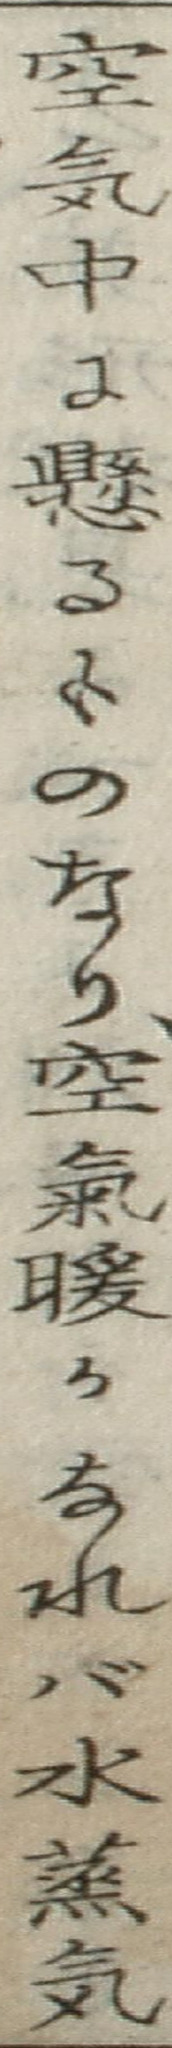空気中に懸るものなり、空気暖かなれば水蒸気
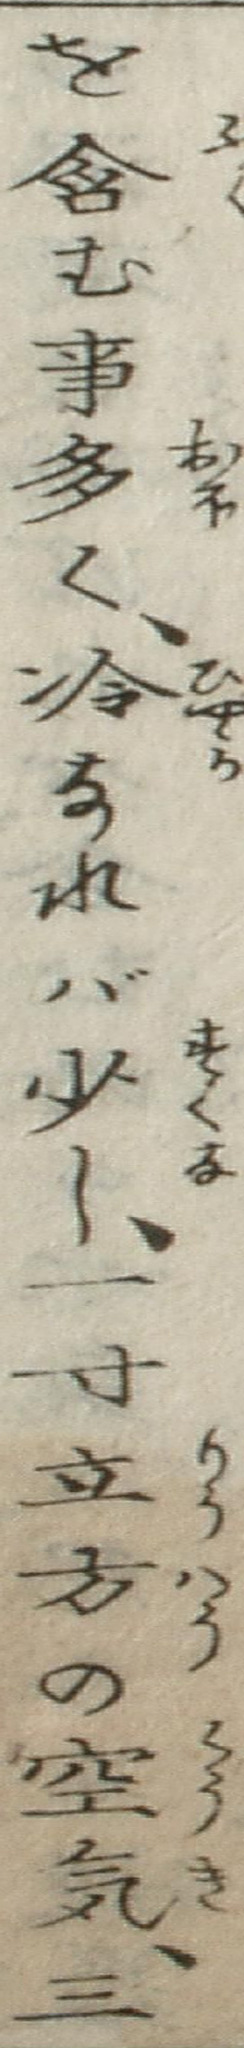を含む事多く、冷なれば、少し、一寸立方の空気、三
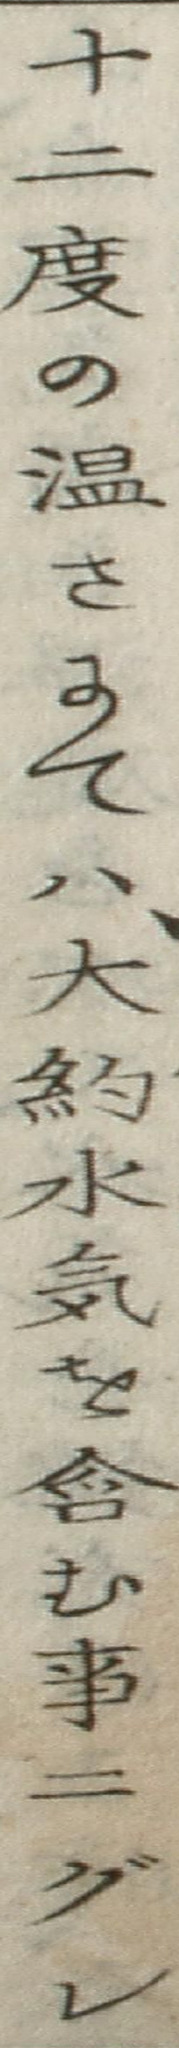十二度の温さにては、大約水気を含む事二グレ
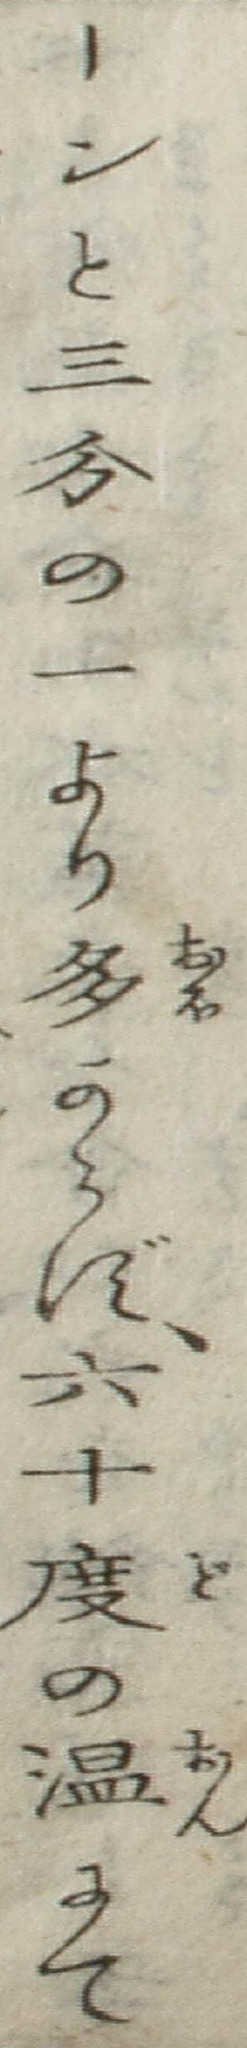ーンと三分の一より多からず、六十度の温にて
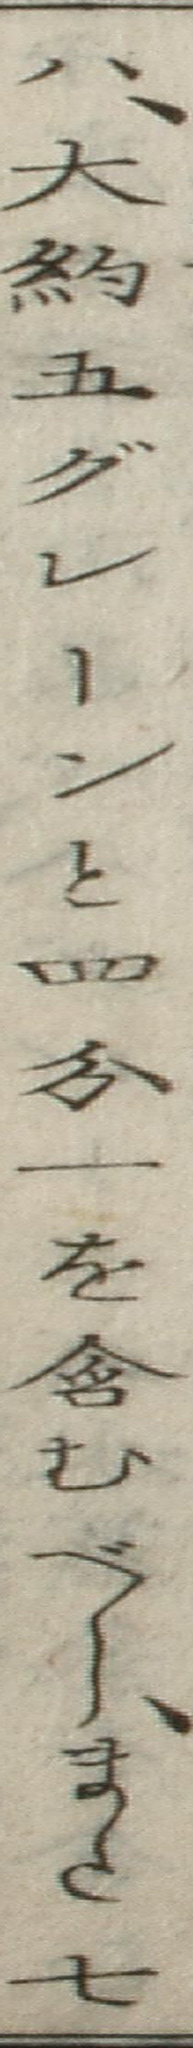は、大約五グレーンと四分一を含むべし、また七

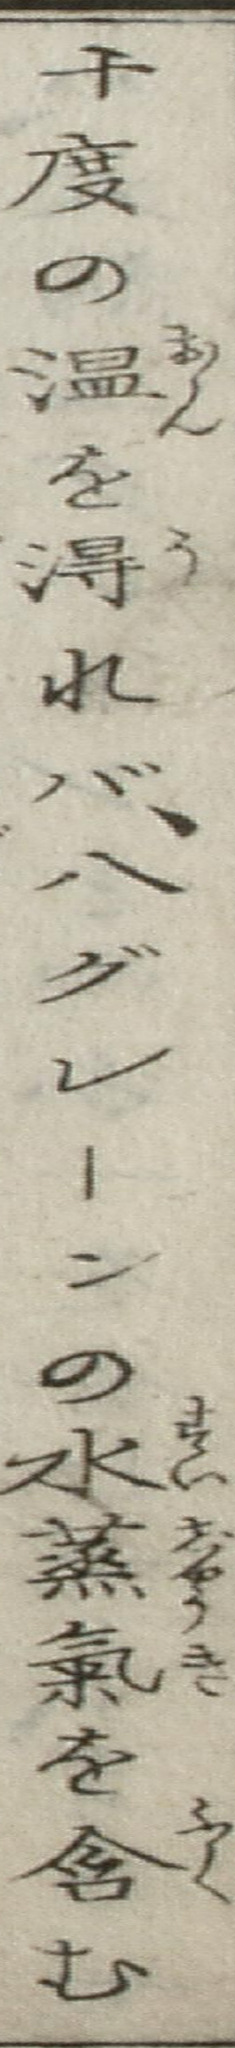千度の温を得れば、八グレーンの水蒸気を含む
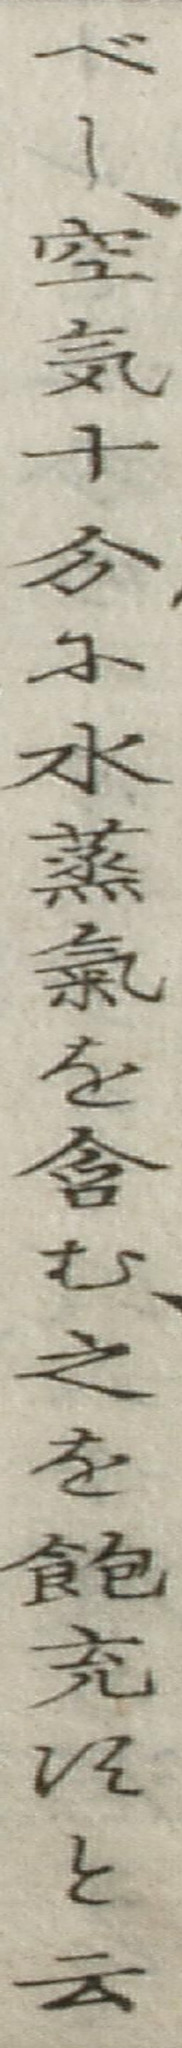べし、空気十分に水蒸気を含む、之を飽充すと云
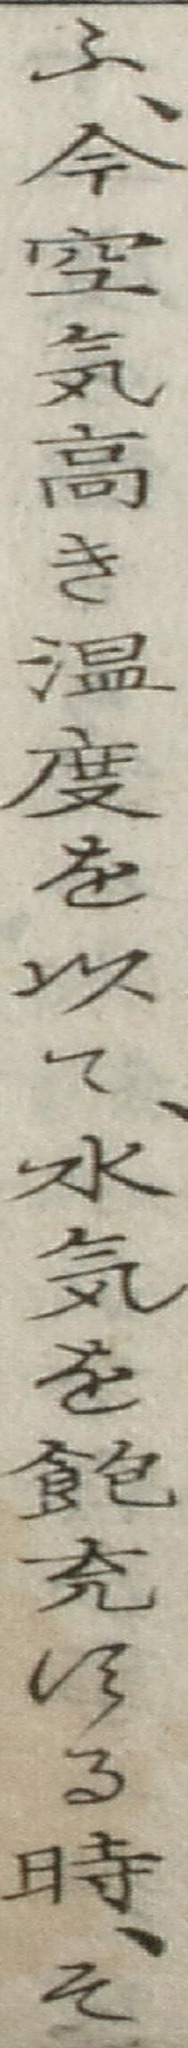ふ、今空気高き温度を以て、水気を飽充する時、そ
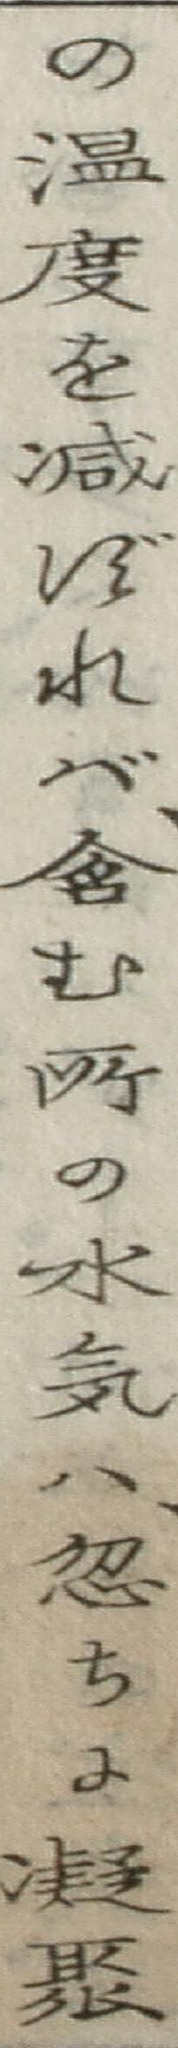の温度を減ずれば、含む所の水気は、忽ちに凝聚
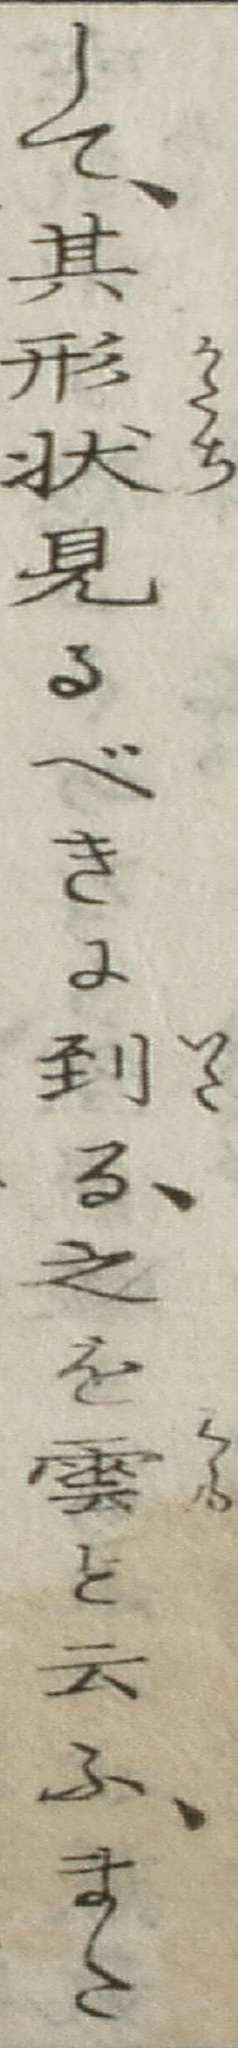して、其形状見るべきに到る、之を雲と云ふ、また
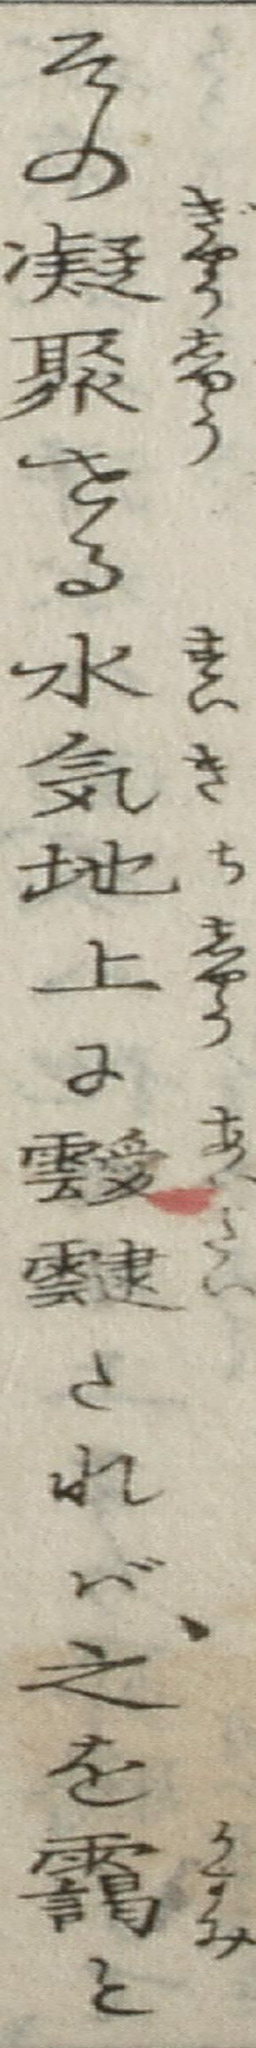その凝聚せる水気地上に靉靆たれば、之を霞と
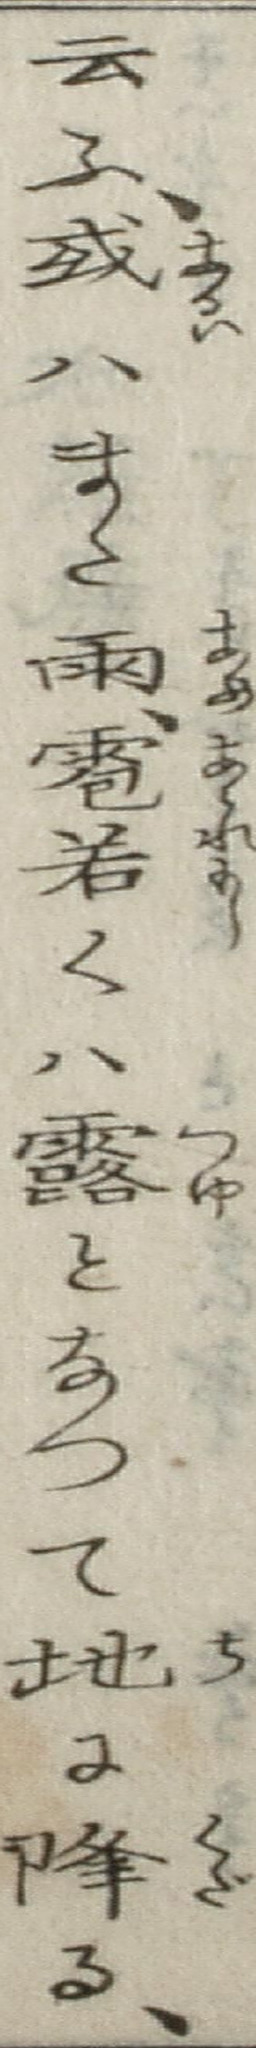云ふ、或はまた雨、雹若くは露となつて地に降る、
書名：訓蒙　天然地理學　下
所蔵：東京大学地震研究所図書室 Earthquake Research Institute Library, The University of Tokyo, JAPAN
